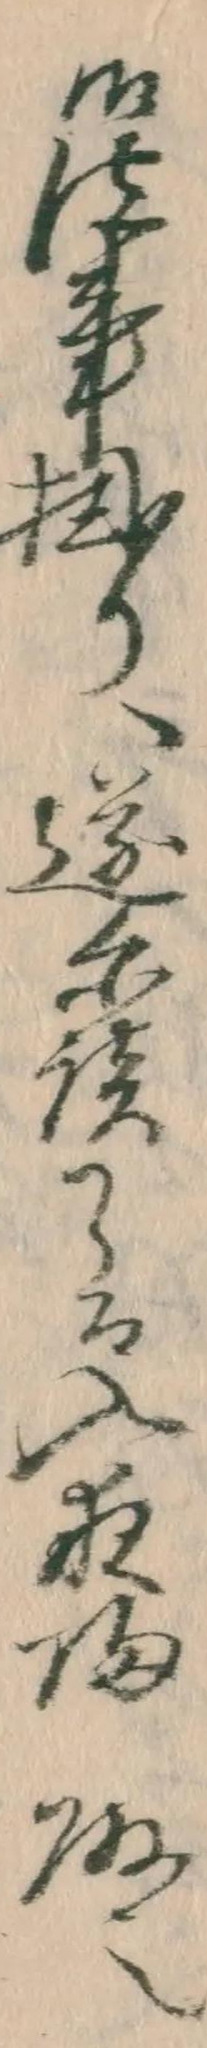御法事掛りへ遂に談了而入夜帰殿也
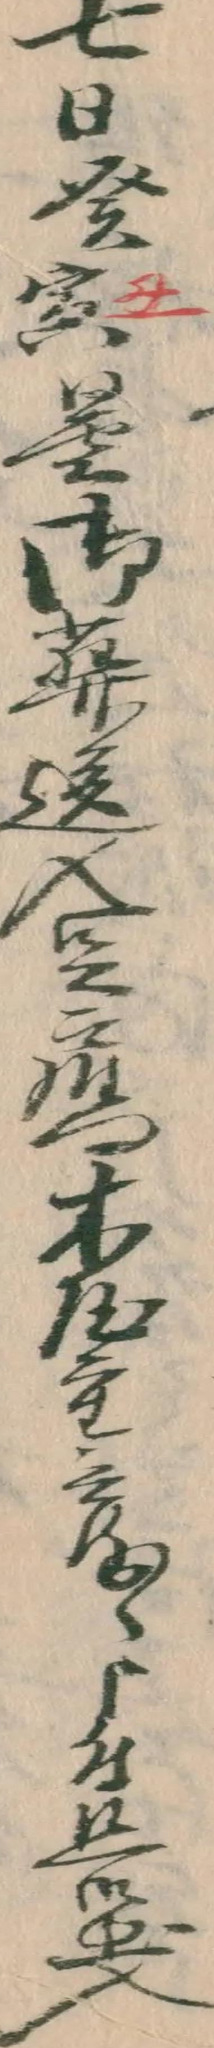七日癸寅曇御葬送入足雇向木屋重蔵へ申付且御出入
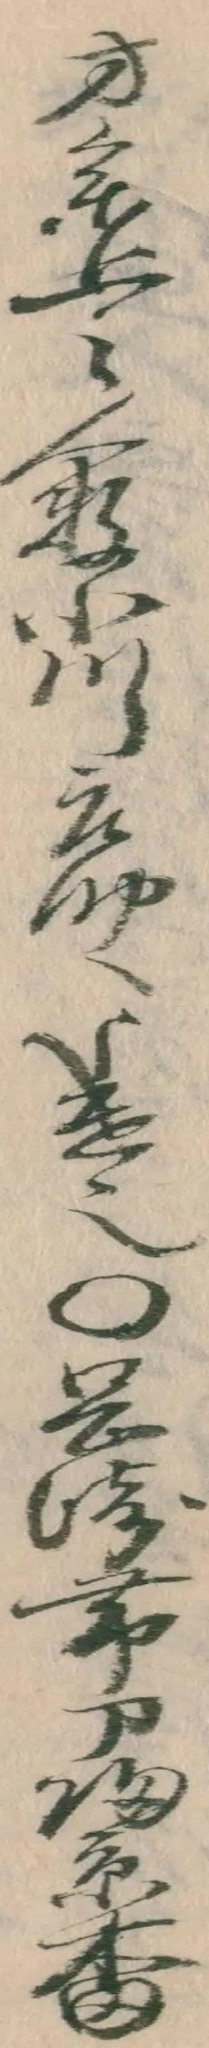方参上之人数小川庄助へ申遣也〇岡崎帯刀帰京木田
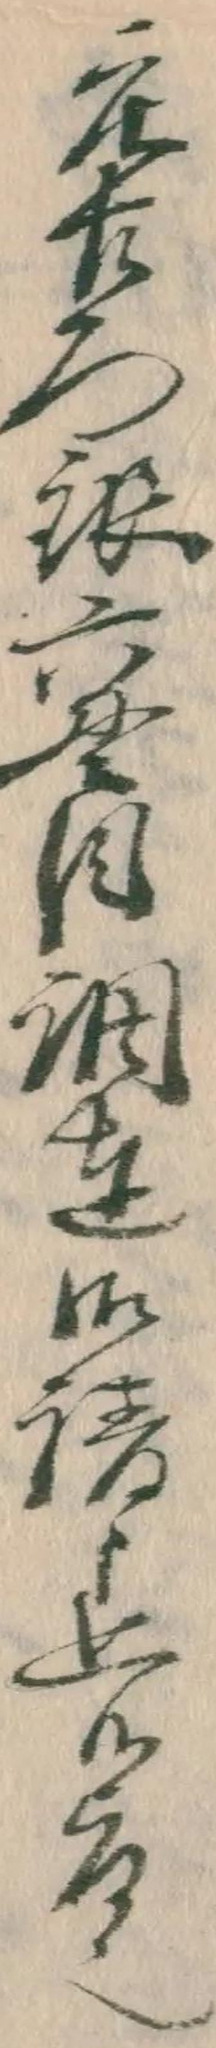庄左衛門銀六貫目調達御請申上候旨也
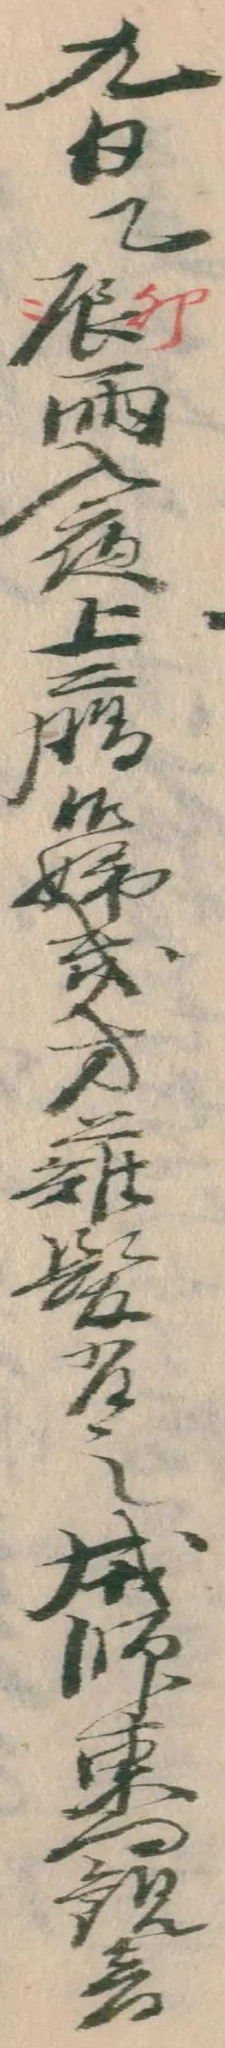九日乙辰雨入夜上臈御姉弟方薙髪有之戒師東向観音
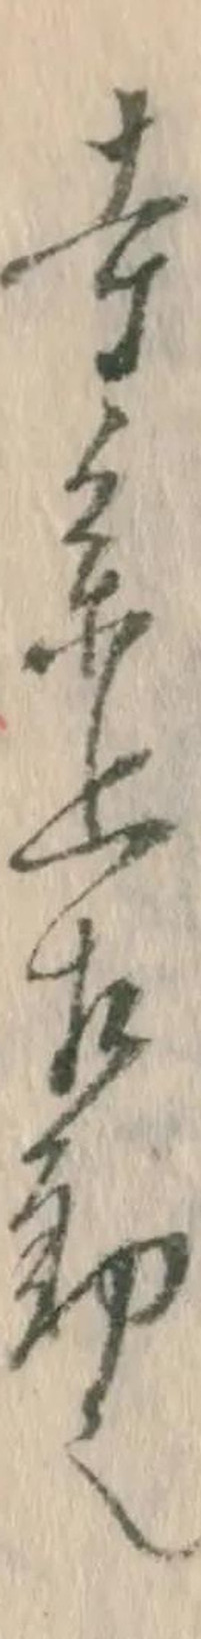寺参上相勤之
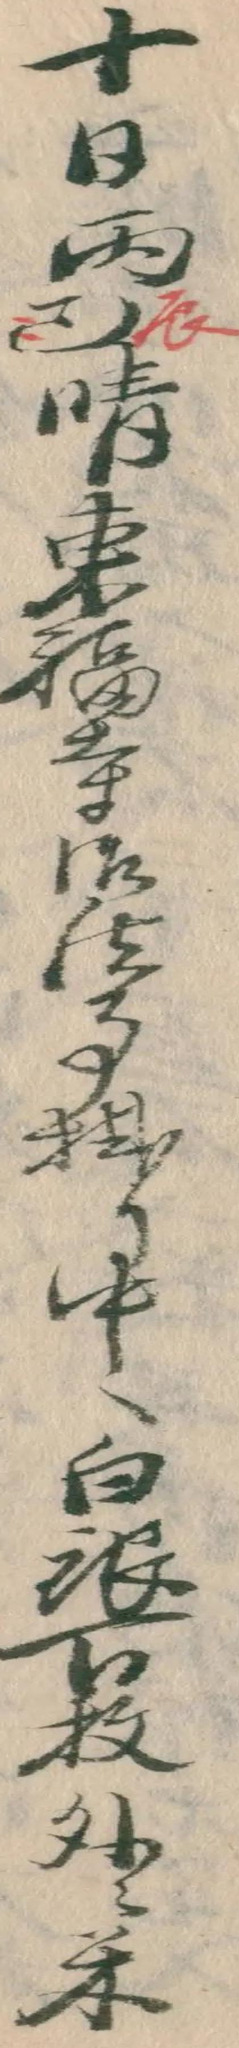十日丙辰晴東福寺御法事掛り中へ白銀百枚外二米
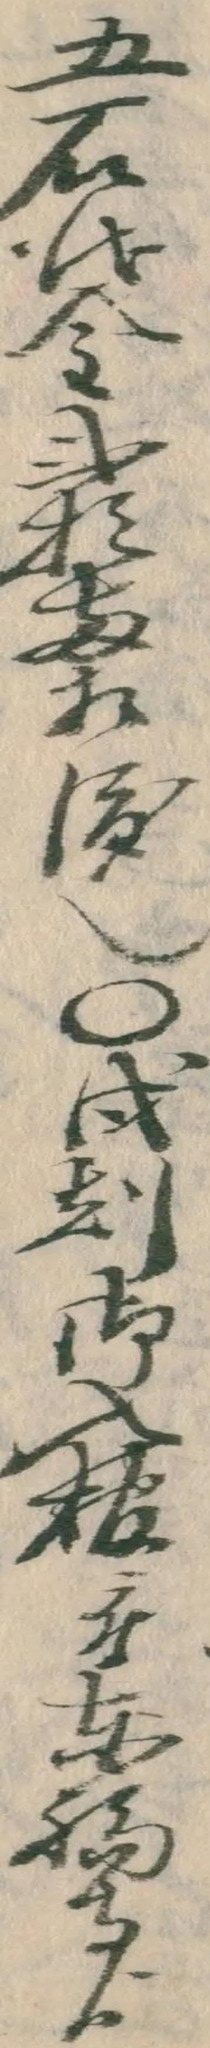五石代金弐拾両相渡也○戌刻御入棺ニ付東福寺ゟ
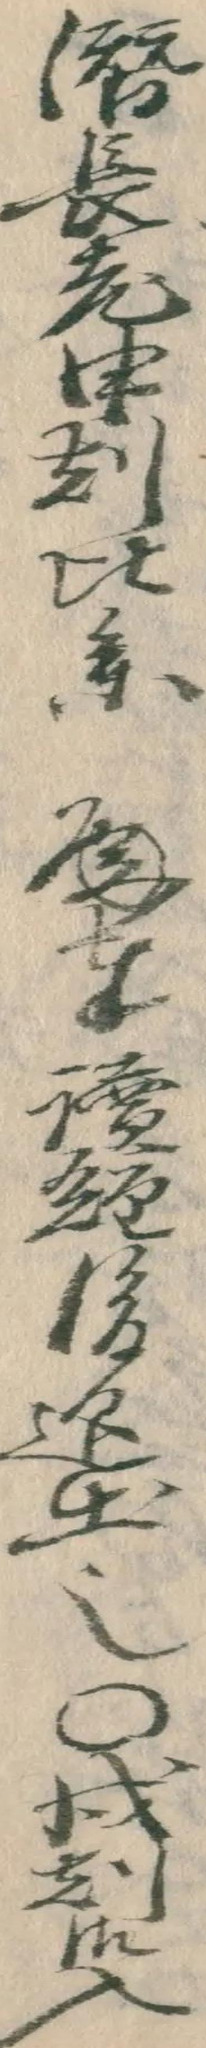潜長老申刻比参殿奉読経後退出也○戌刻御入
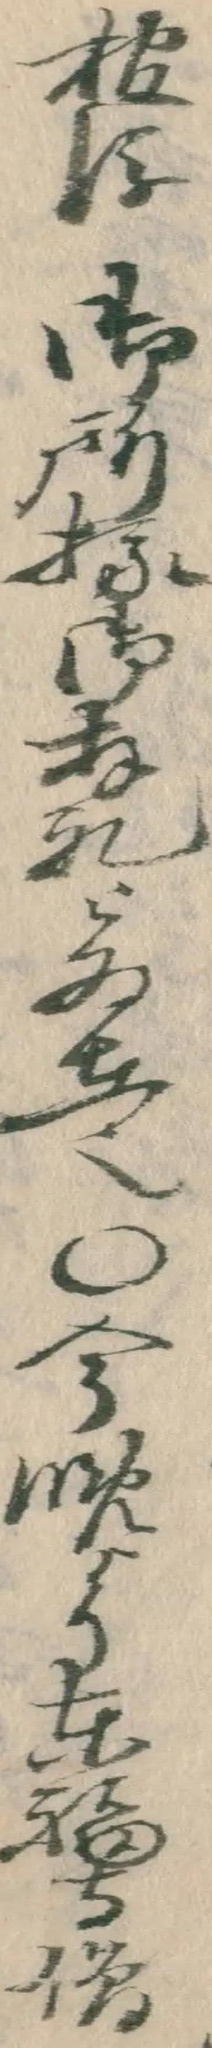棺後御所様御拝礼被為在也○今晩より東福寺僧
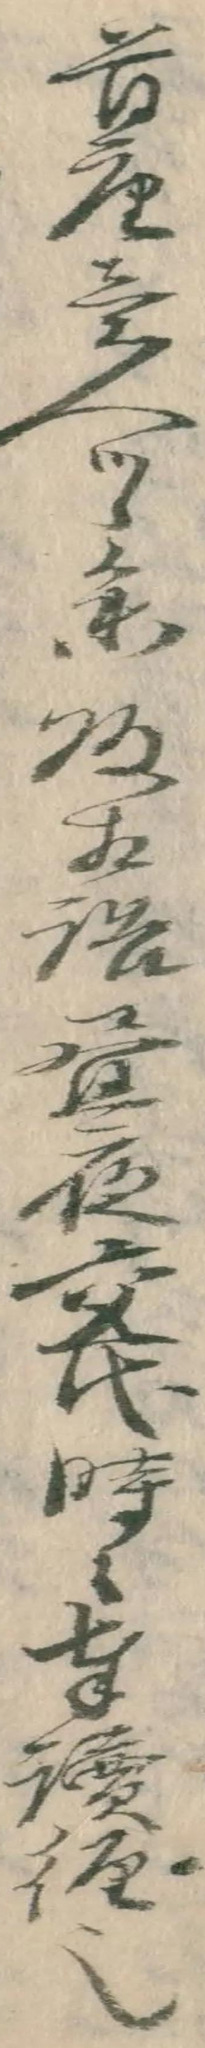首座壱人ツヽ参殿相詰昼夜交代時々奉読経也
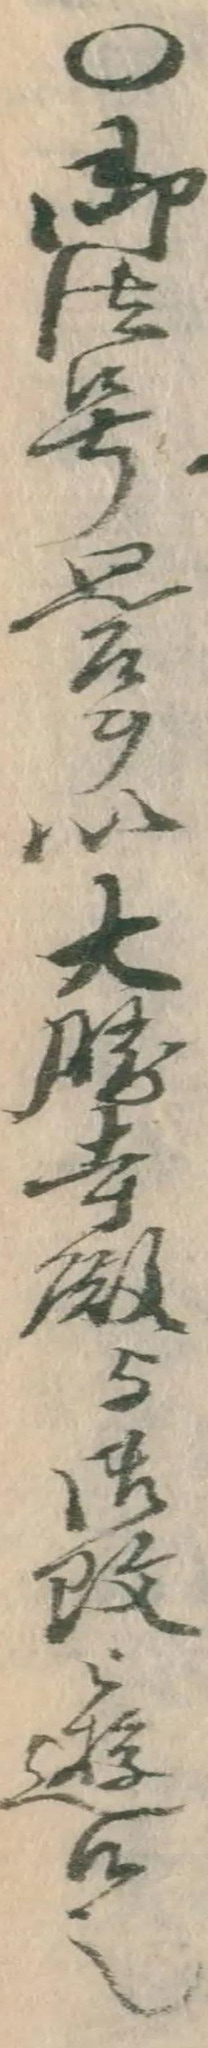○御法号思召ヲ以大勝寺殿と御改被遊候也

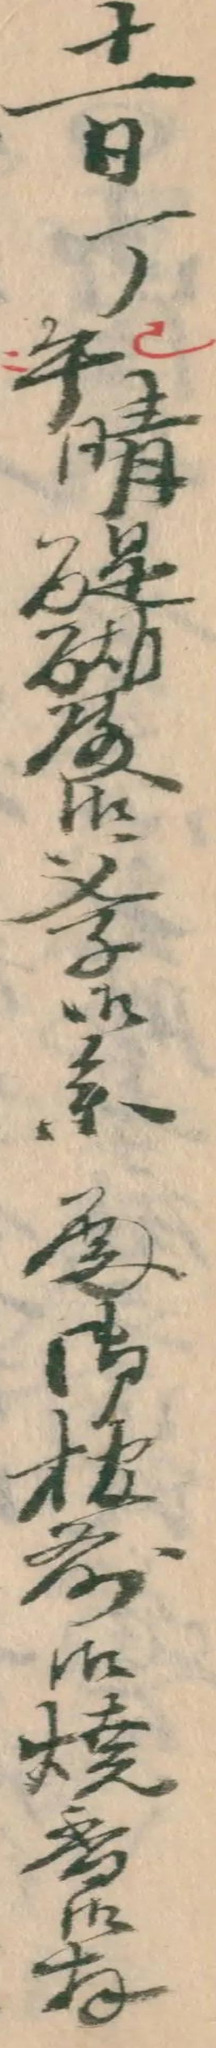十一日丁午晴醍醐殿御父子御参殿御棺前御焼香御拝
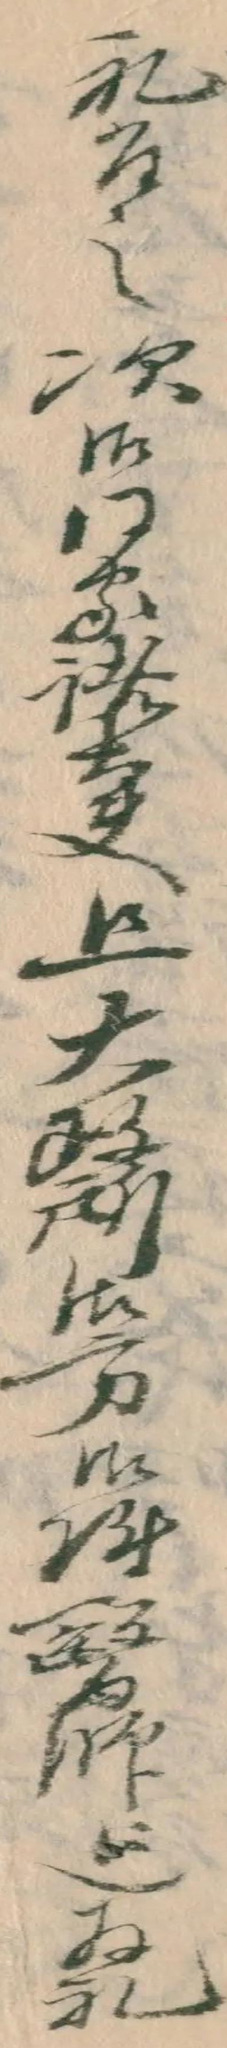礼有之次御同家格大夫且大政所御方御附醫師迄拝礼
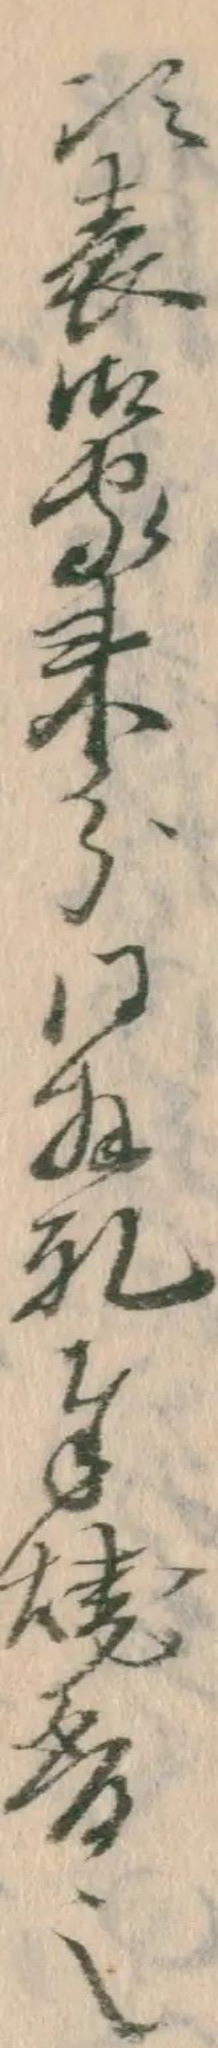次表御家来分同拝礼奉焼香也
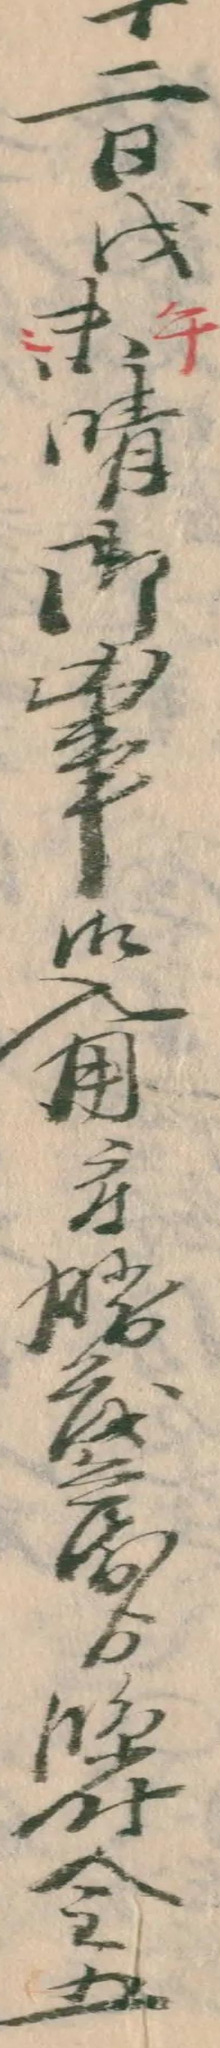十二日戊未晴御凶事御入用ニ付勝茂兵衛ゟ臨時金五
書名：賀茂社記録. 第67冊
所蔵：国立国会図書館 National Diet Library, JAPAN
